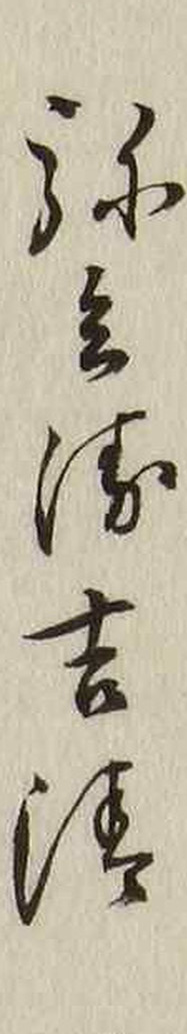忠兵衛吉重
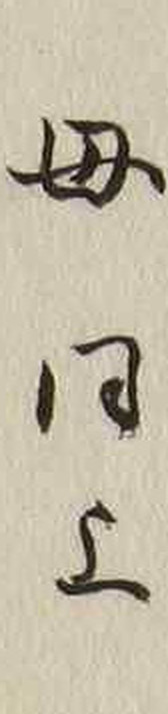母同上
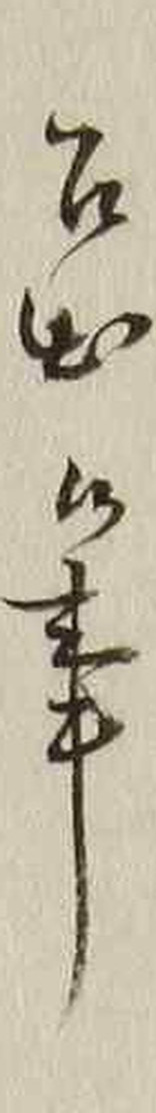召出候事
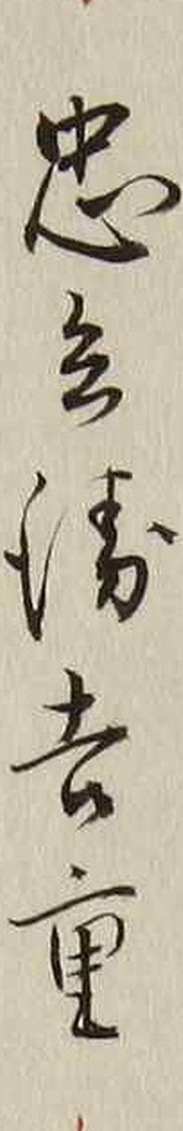忠兵衛吉重
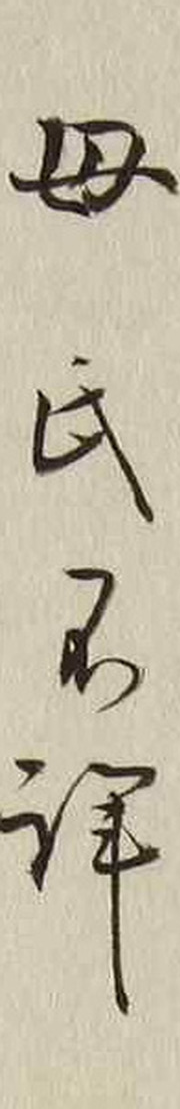母氏不詳
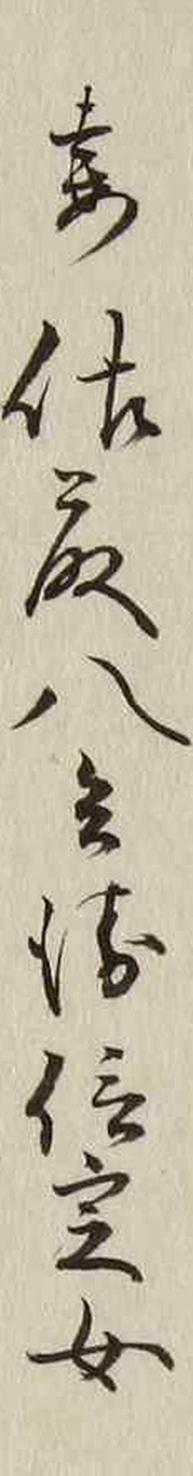妻佐藤八兵衛信定女
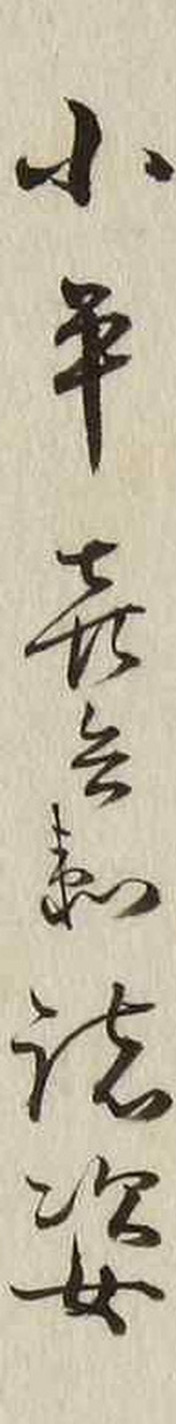小平喜兵衛諸次女
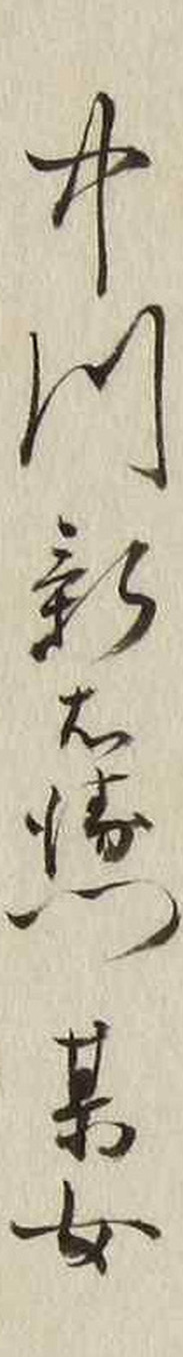中川新右衛門某女
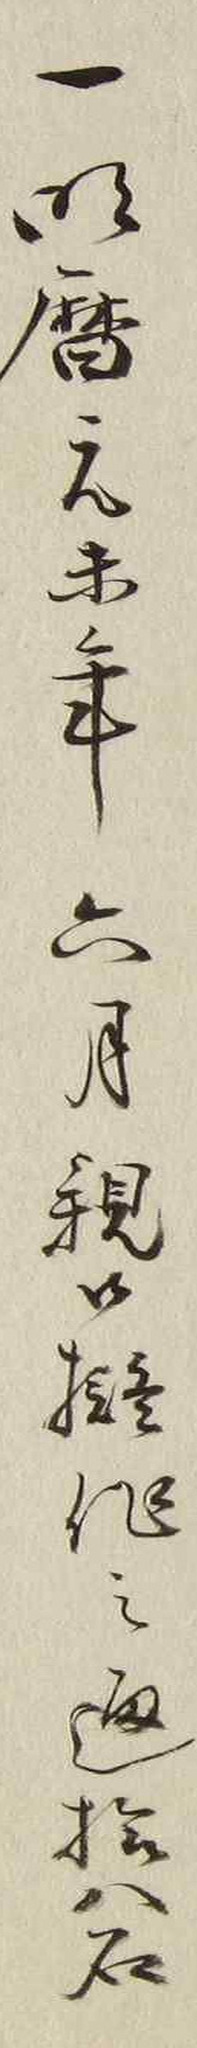一明暦元未年六月親御擬作之通拾八石
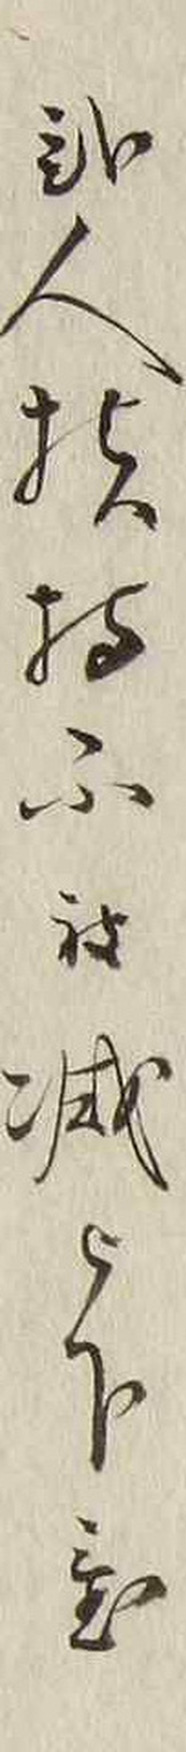弐人扶持不被減被下置
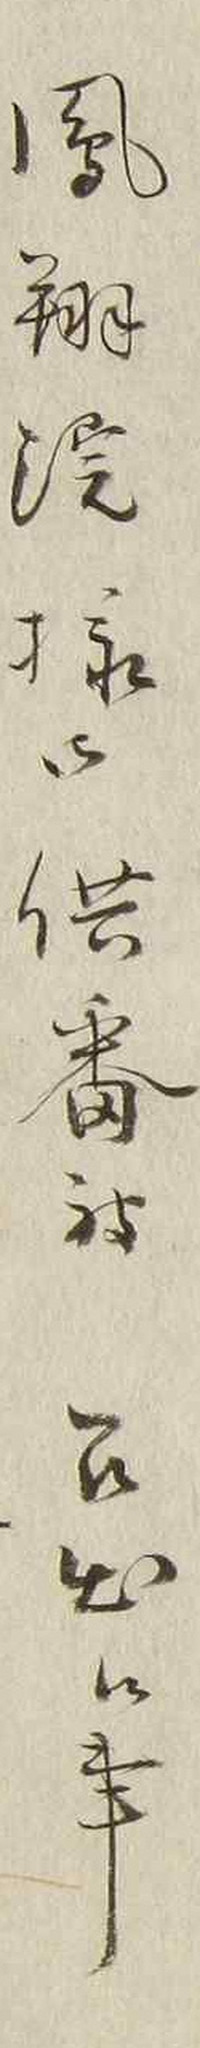鳳翔院様御供番被召出候事
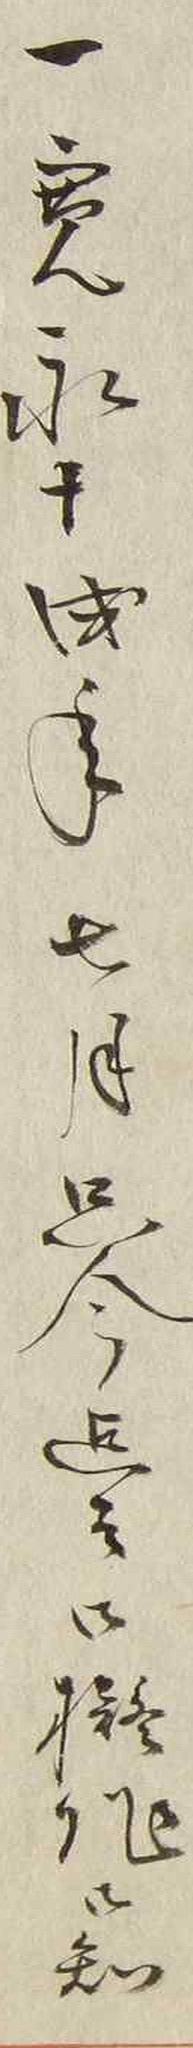一寛永十戌年七月只今迄は御擬作御知

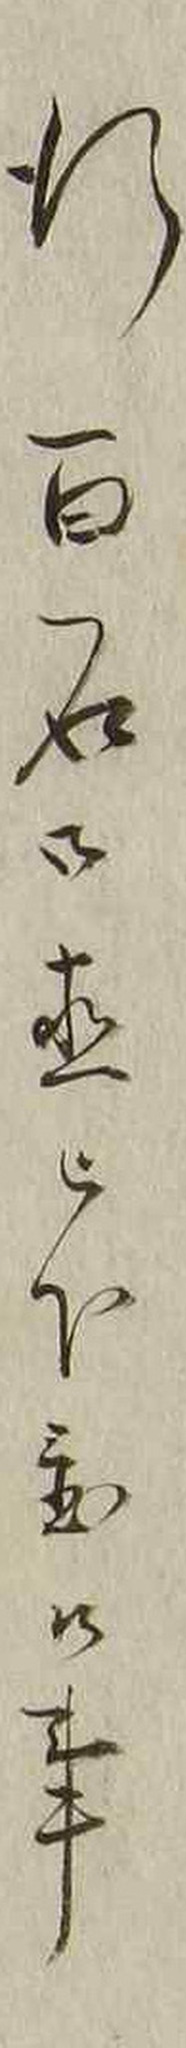行百石御直被下置候事
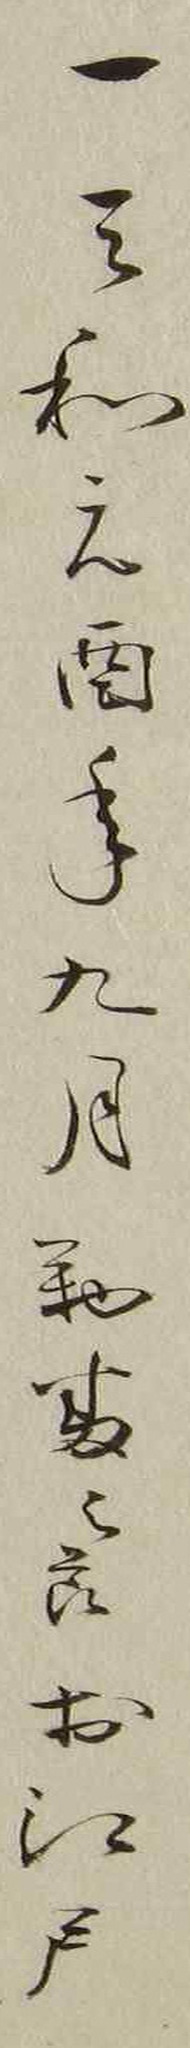一天和元酉年九月勤番之節於江戸
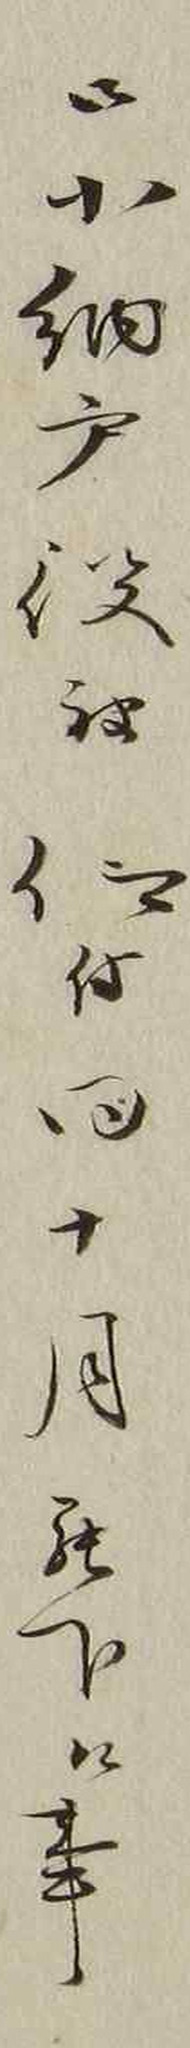御小納戸役被仰付同十月罷下候事
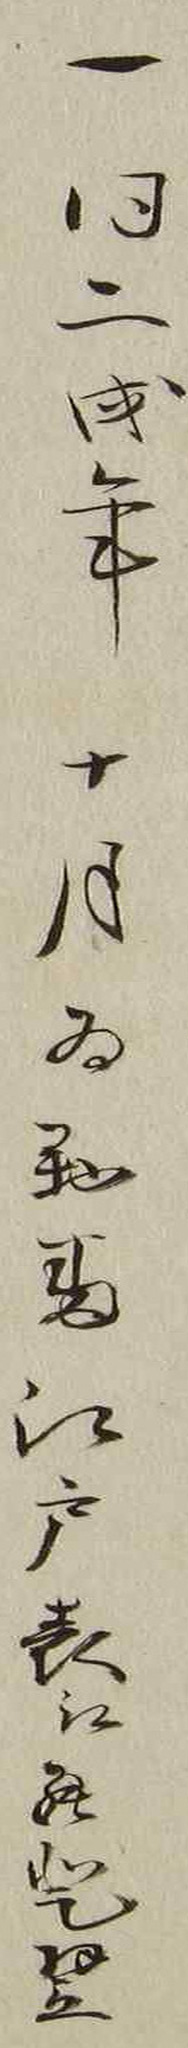一同二戌年十月為勤番江戸表え罷登翌
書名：諸士系譜　巻之157　ね之部1
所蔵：会津若松市立会津図書館
